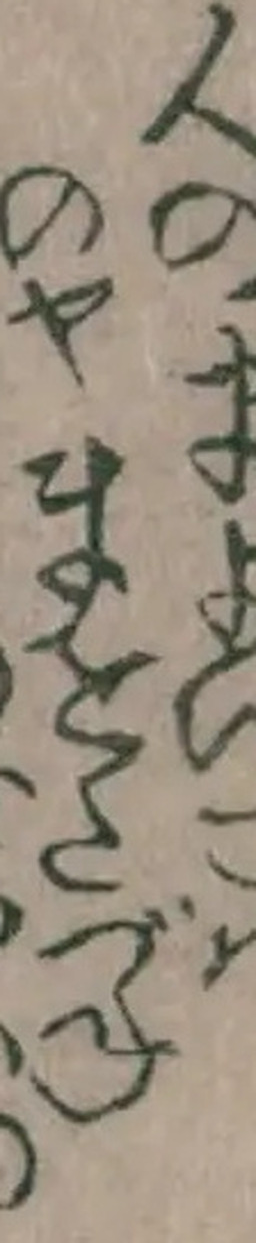のやまをたづね
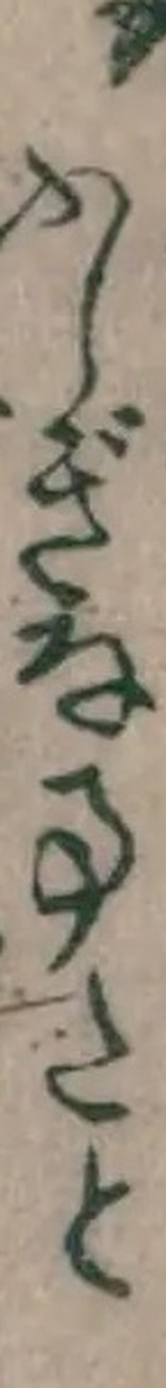ふしぎな事たと
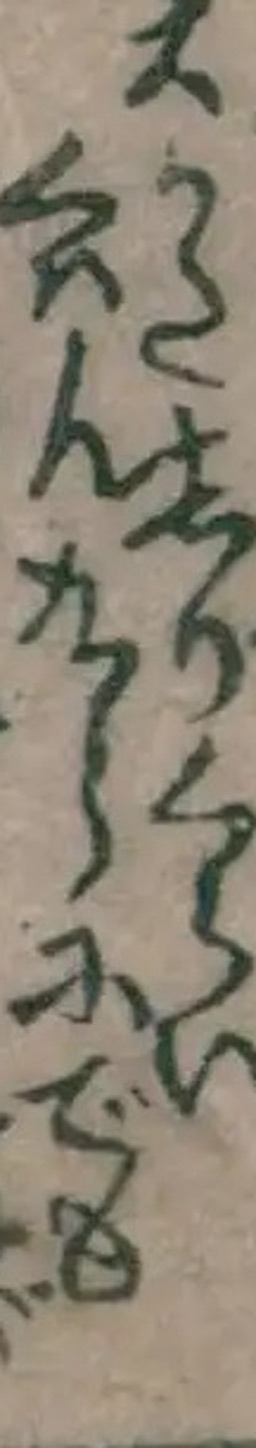くはんのうにでも
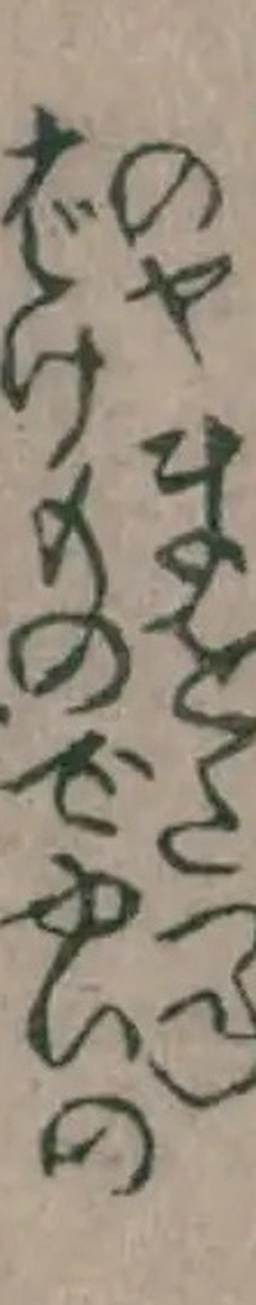ばけものでやいの
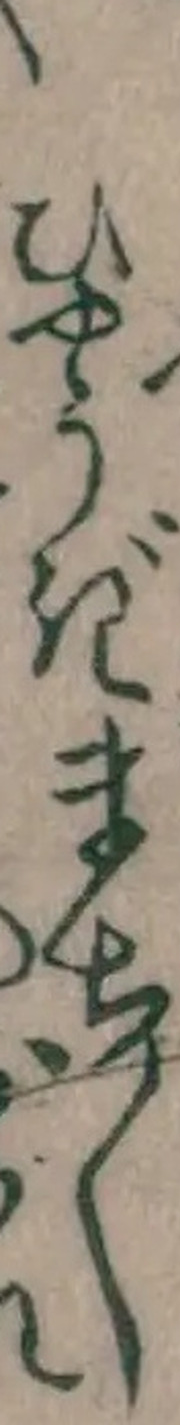ひやうぎまち〳〵
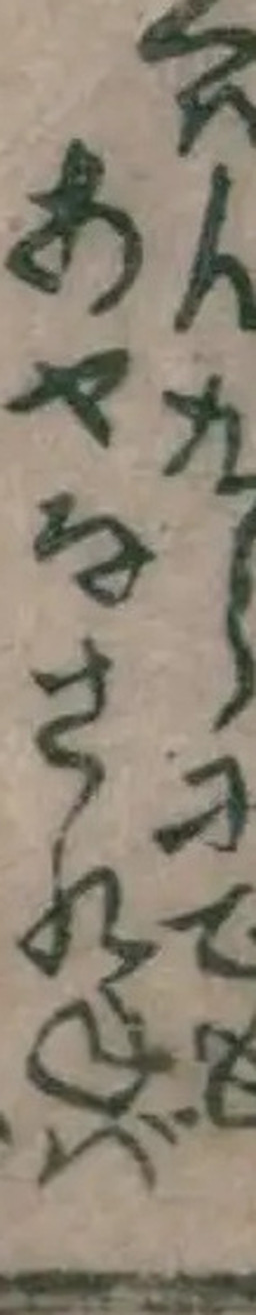あやなされねば
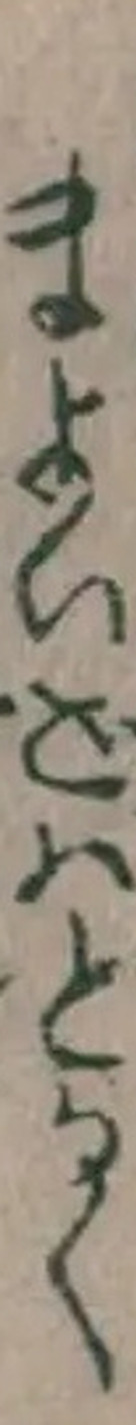まよいごハとかく
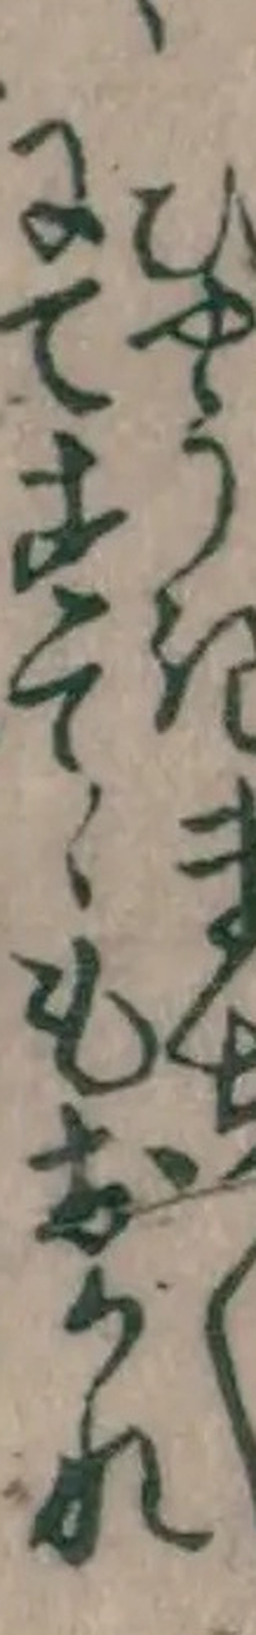にてすてゝもおかれ
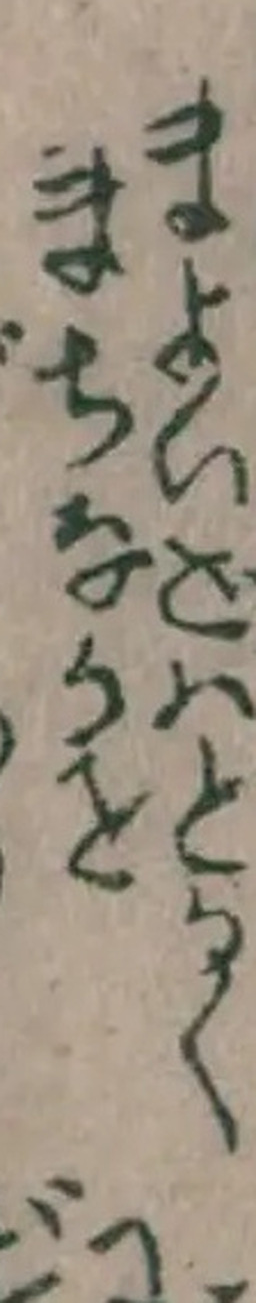まちなかを
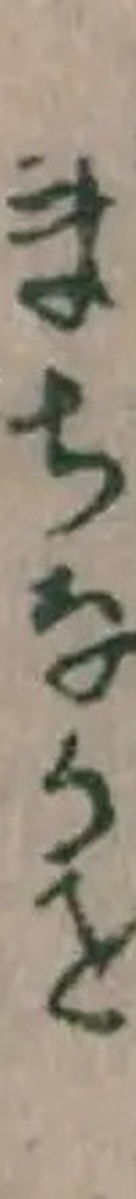まちなかを
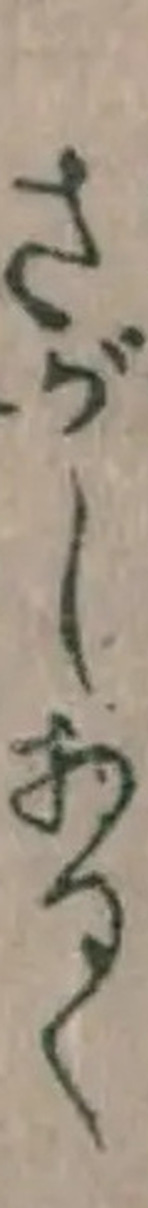さがしあるく
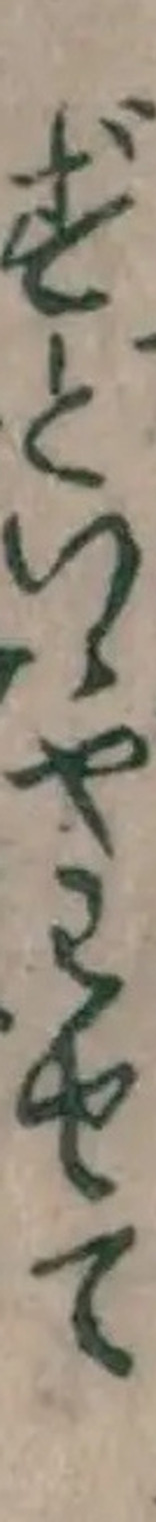ずといゝやわせて
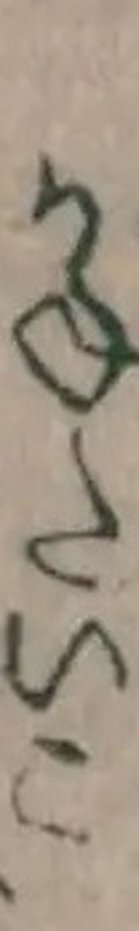かねたいこ
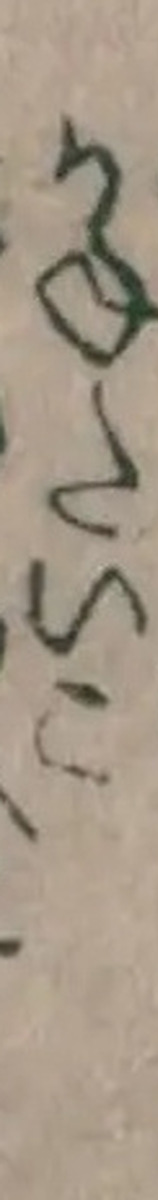かねたいこ
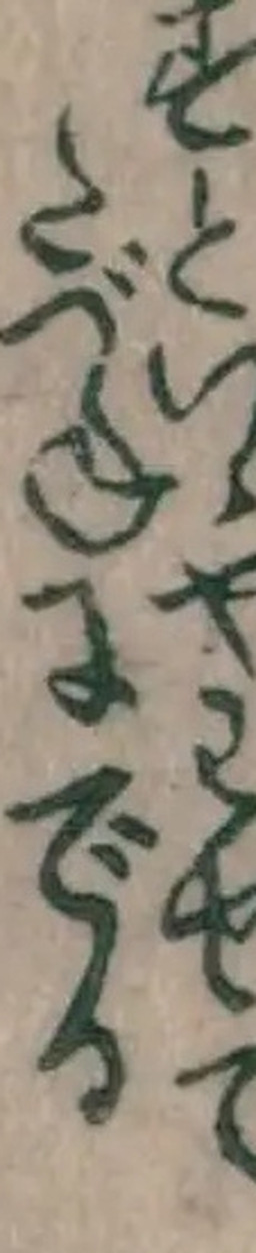たづねにでる
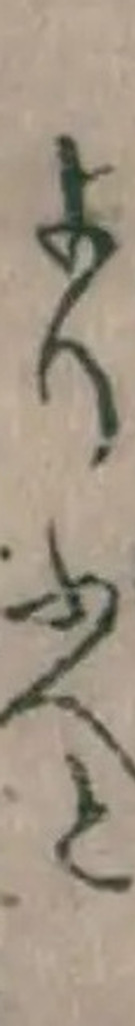よりふへと
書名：信有奇怪会
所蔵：国立国会図書館 National Diet Library, JAPAN
